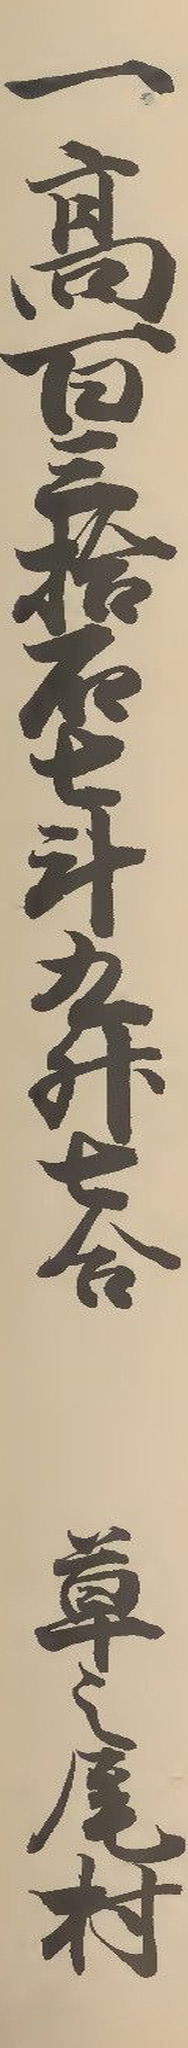一髙百三拾石七斗九升七合草之尾村
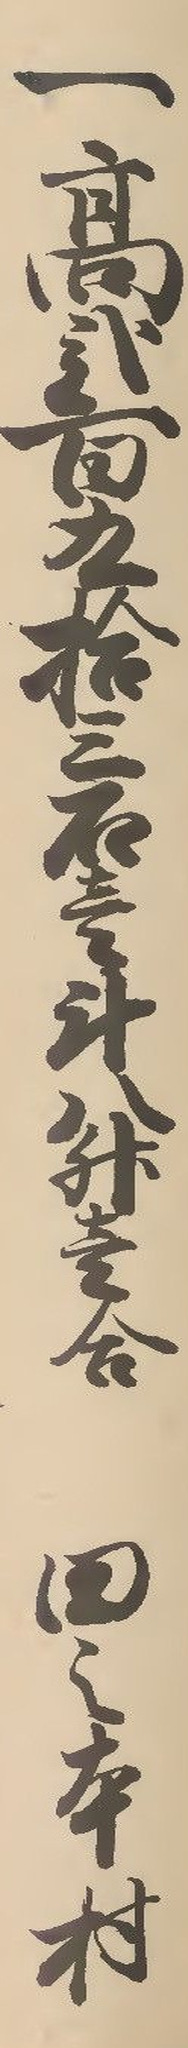一髙弐百九拾三石壱斗八升壱合田之本村
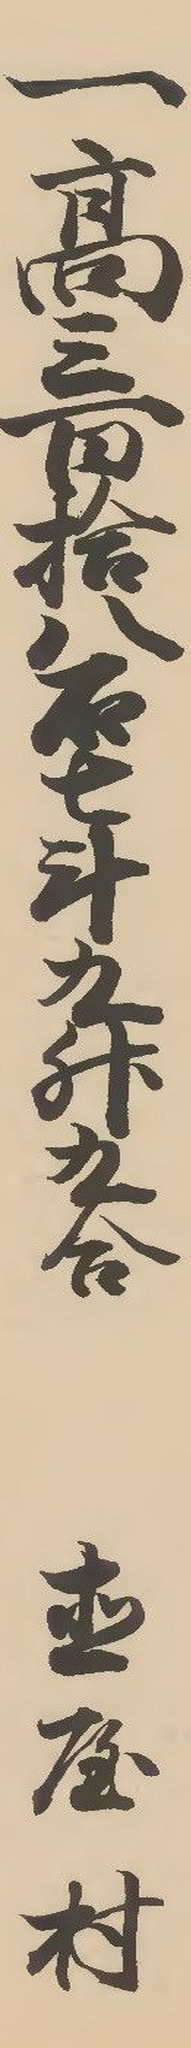一髙三百拾八石七斗九升九合直屋村
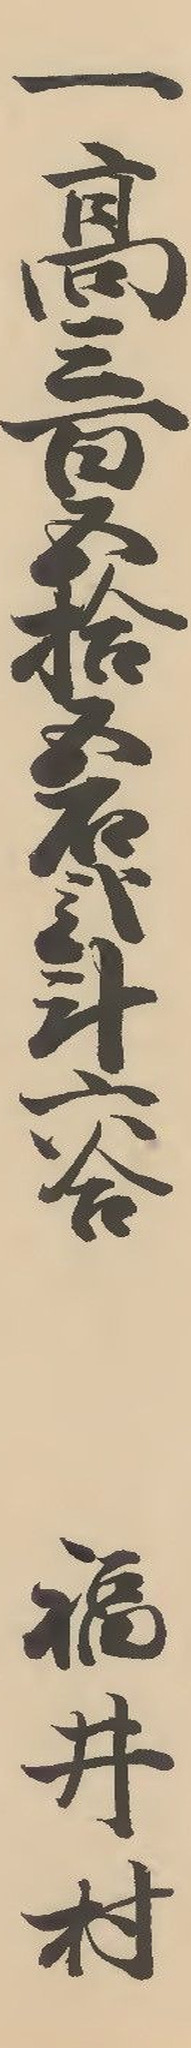一髙三百五拾五石弐斗六合福井村
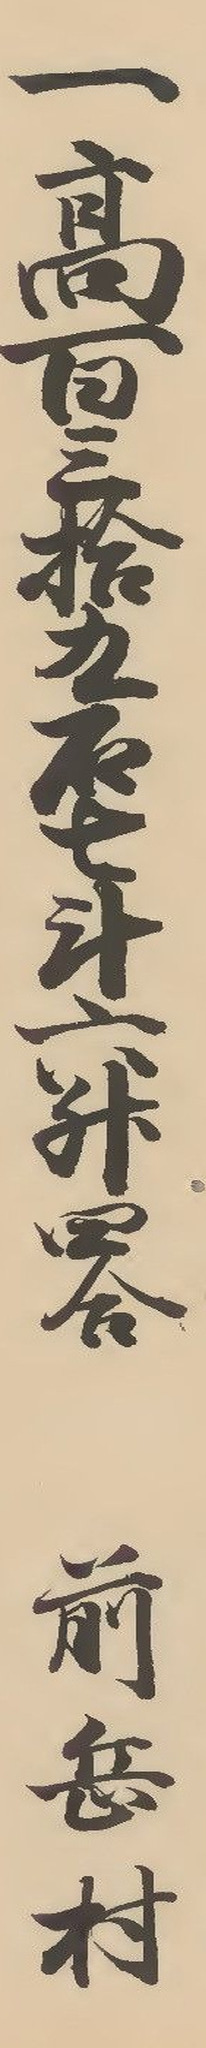一髙百三拾九石七斗六升四合前岳村

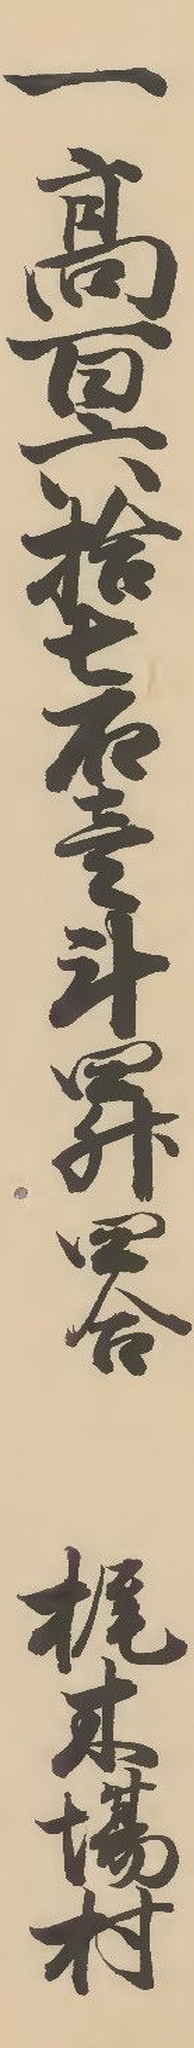一髙百六拾七石壱斗四升四合梶木場村
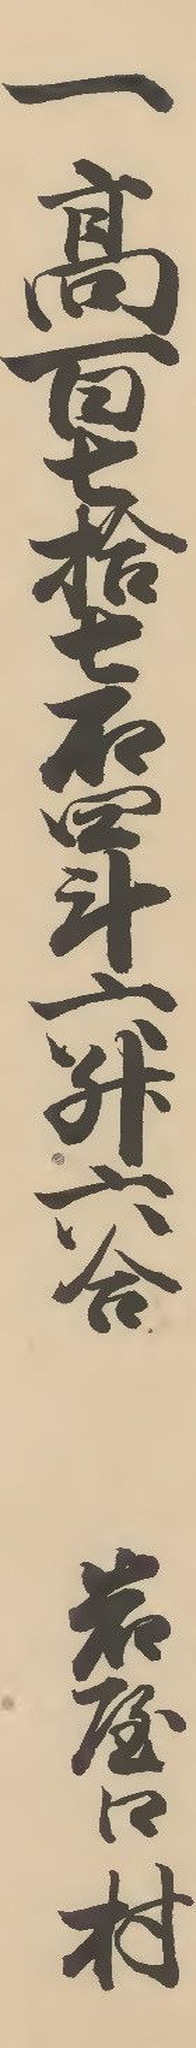一髙百七拾七石四斗六升六合岩屋口村
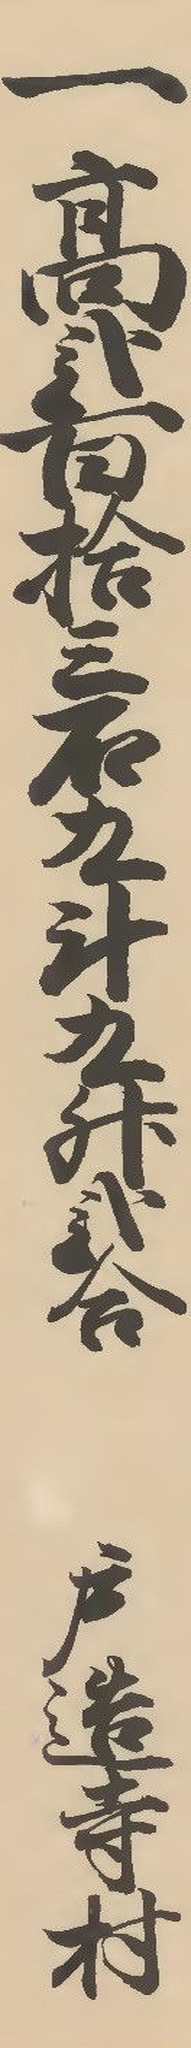一髙弐百拾三石九斗九升弐合戸造寺村
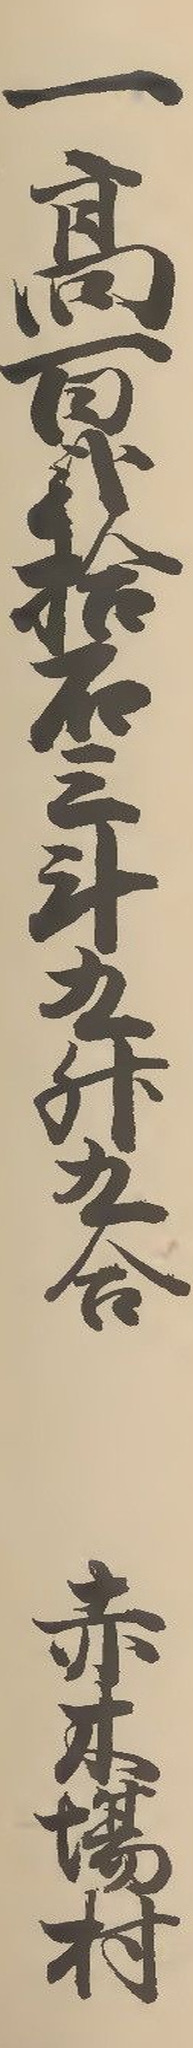一髙百弐拾石三斗九升九合赤木場村
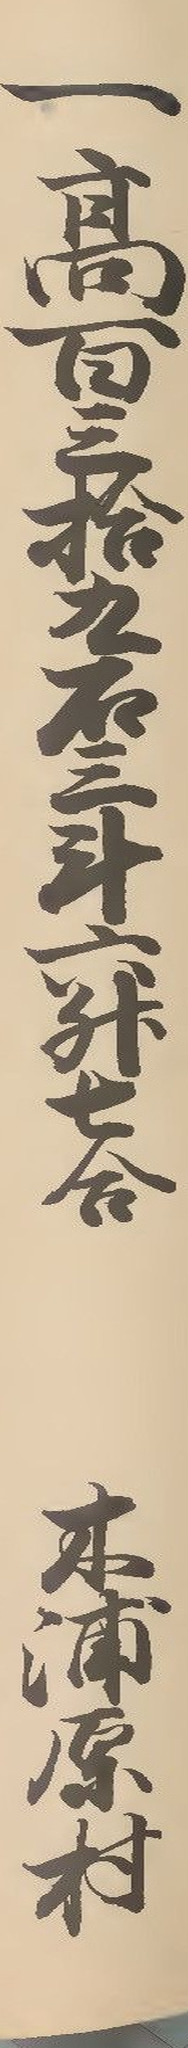一髙百三拾九石三斗六升七合木浦原村
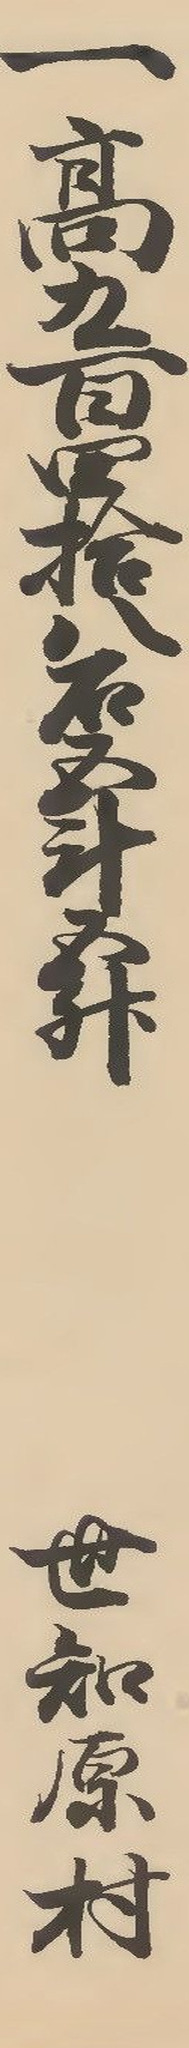一髙九百四拾八石五斗五升世知原村
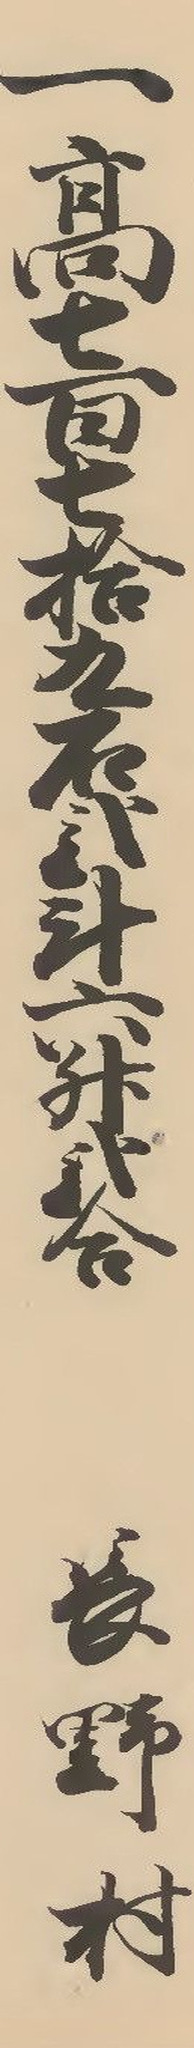一髙七百七拾九石弐斗六升弐合長野村
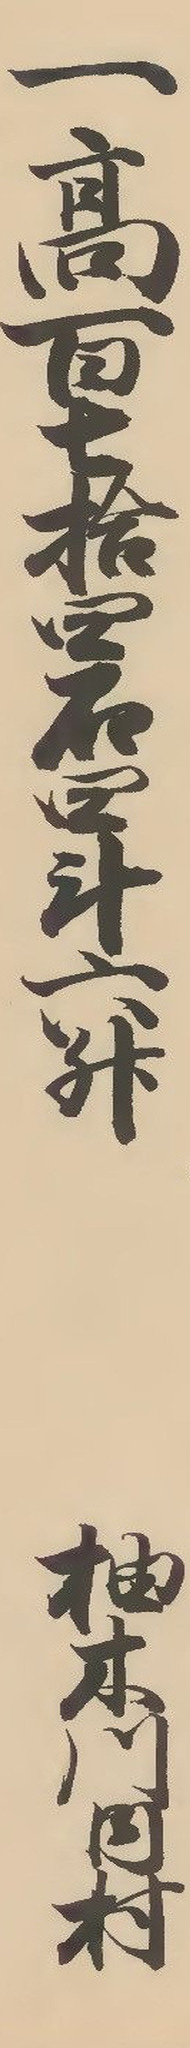一髙百七拾四石四斗六升柚木川内村

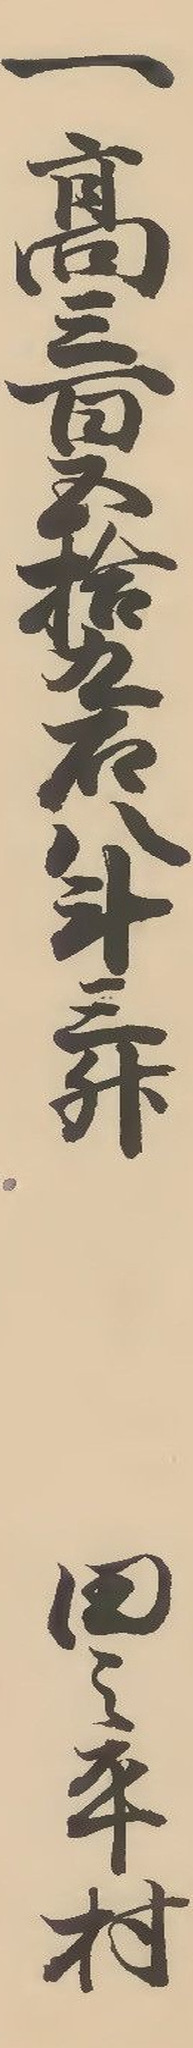一髙三百五拾九石八斗三升田之平村
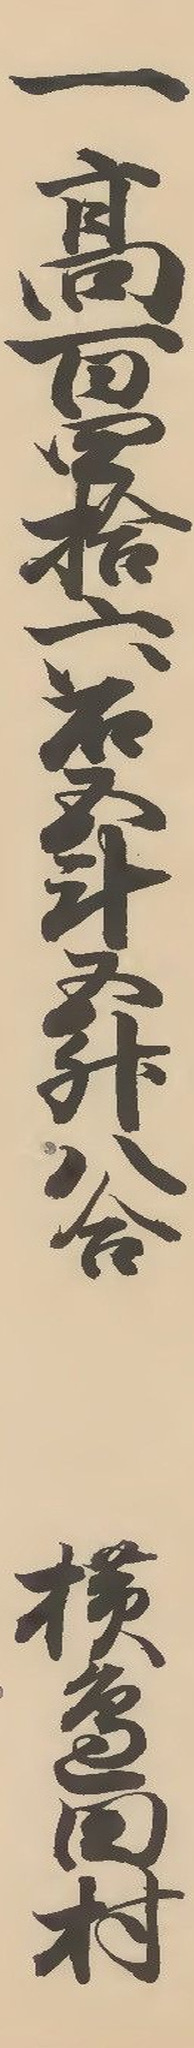一髙百四拾六石五斗五升八合横邊田村
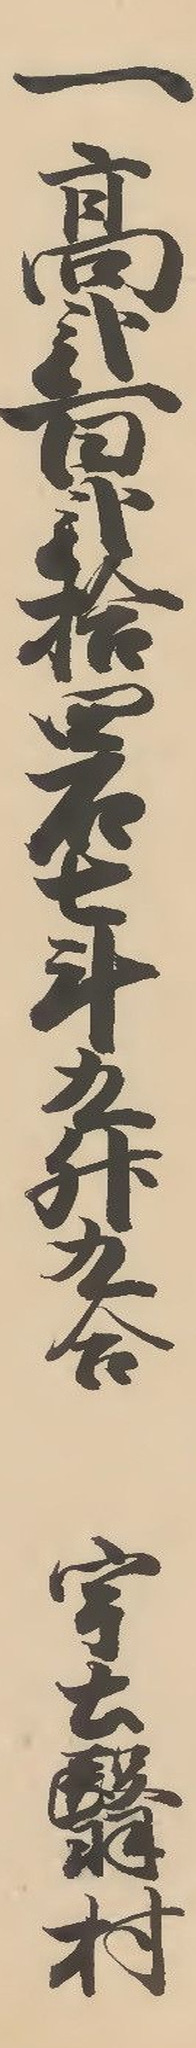一髙弐百弐拾四石七斗九升九合宇土村
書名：肥前国郷帳
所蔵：国立公文書館 National Archives of Japan
